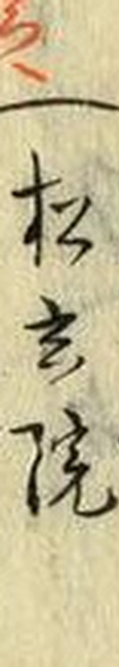松玄院
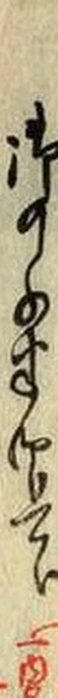御のしめ半御上下
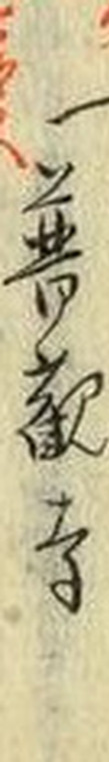普観寺
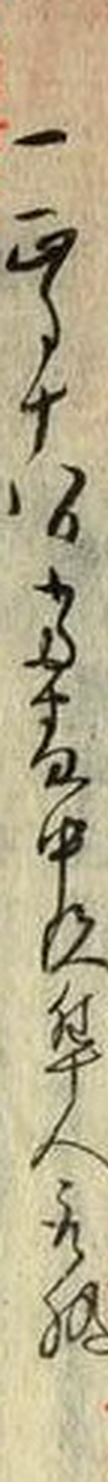一正月十八日当番中沢隼人取扱
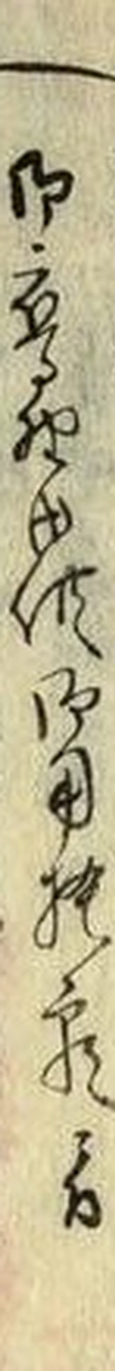御鷹野御供御用捨願候ニ付
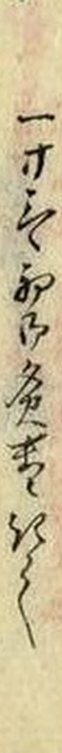一廿三日初御灸末ニ記之
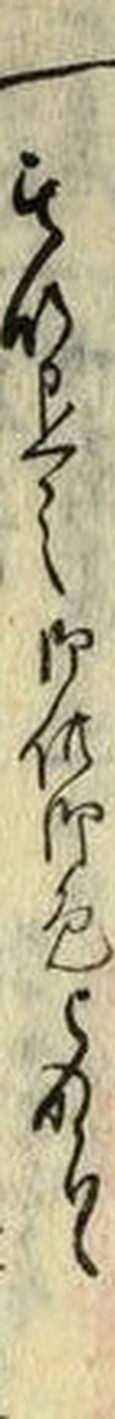其段申上之御供御免被成下候
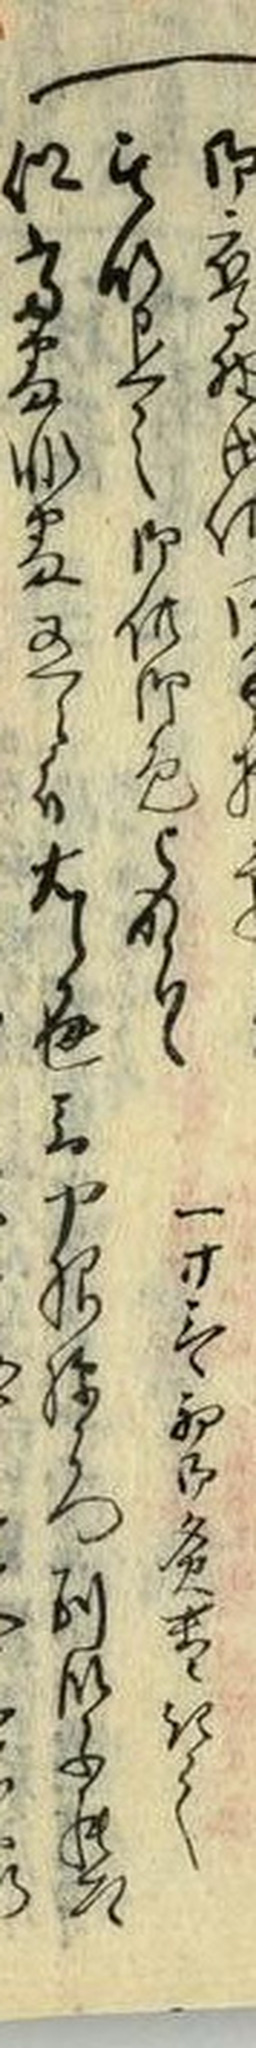但当番非番有之候ニ付右之通ニ而中根孫右衛門別段不罷出候
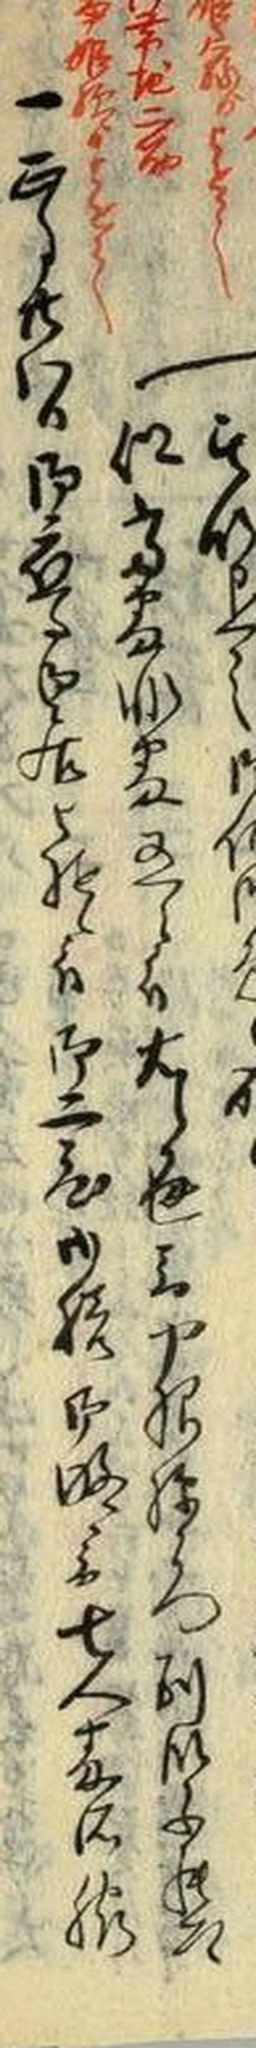一正月廿八日御鷹御居被遊候ニ付御二度御膳御略候ニ而七人番所脇
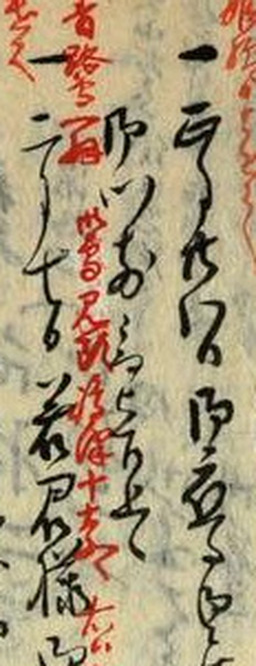御門前ニ而被召上候
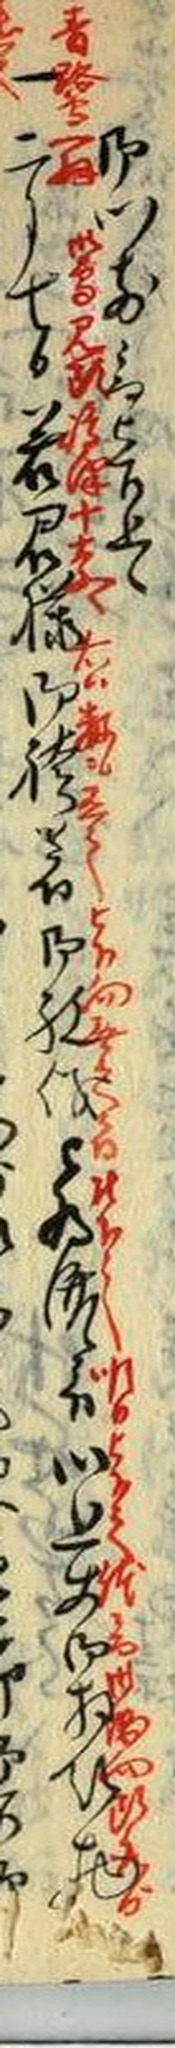一二月七日若君様御袴着御祝儀被為済候ニ付以上使御拝領物
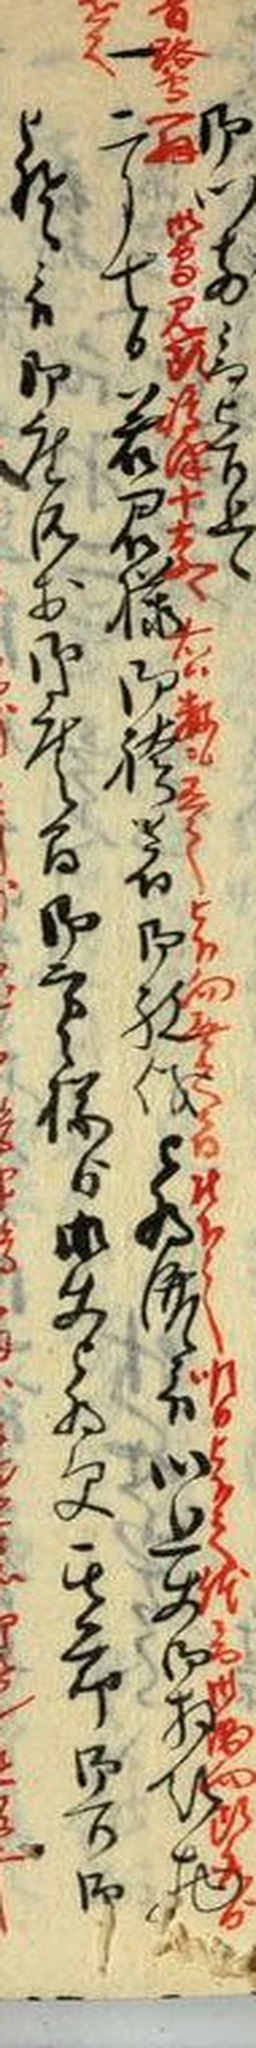被遊候ニ付御座所於御座之間御方々様ゟ御使被為受其節御召御
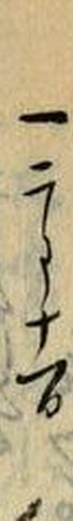一二月十一日
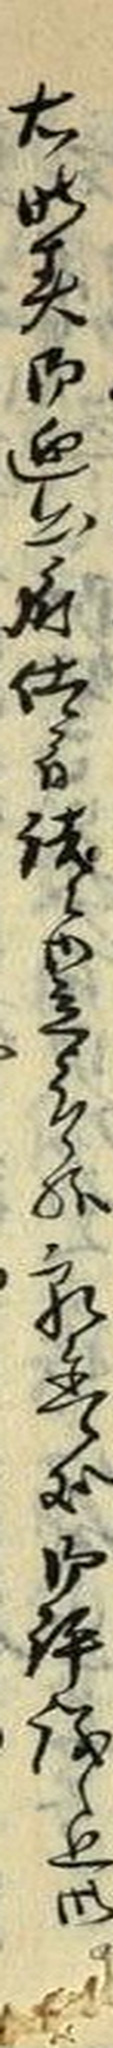右昨春御迎出府仕候ニ付諸々御立被下候様願置候処御評議之上御
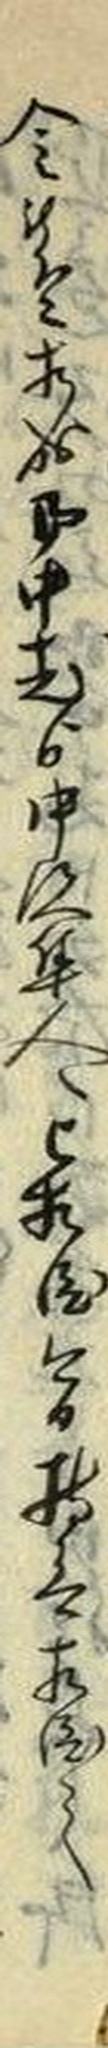金被下ニ相成御中老ゟ中沢隼人へ被相渡今日持参相渡之
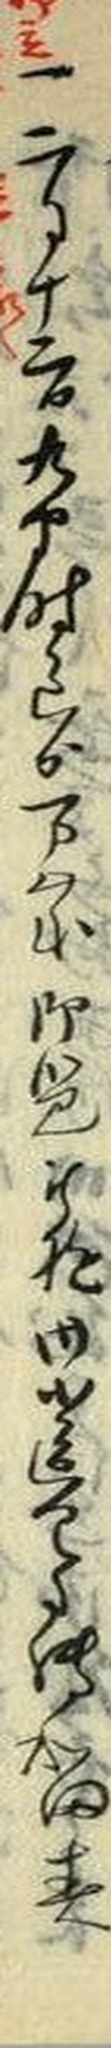一二月十二日九半時過ゟ万歳御覧被遊御小道具手伝和田春
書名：少傅日録抄（斉承付側向頭取日記、在国）
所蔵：福井県文書館 Fukui Prefectural Archives
